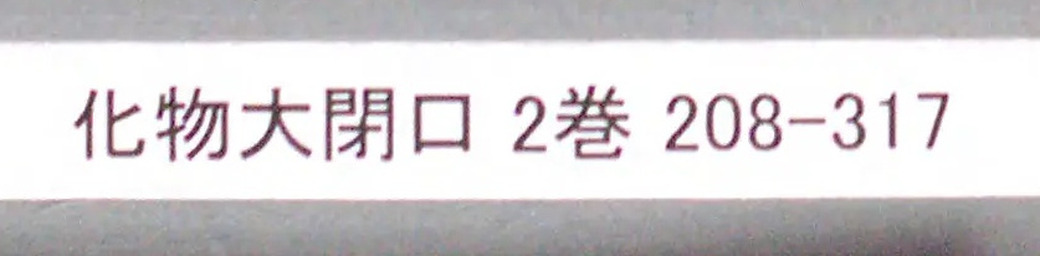化物大閉口全

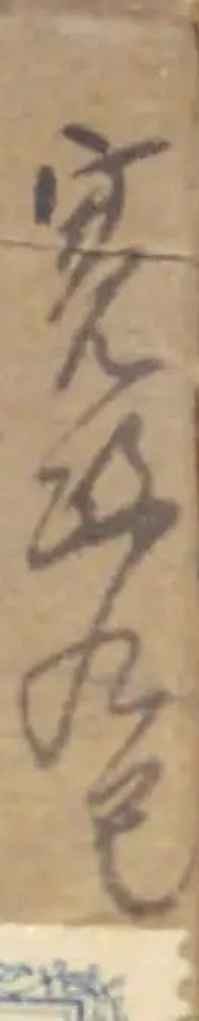寛政九巳
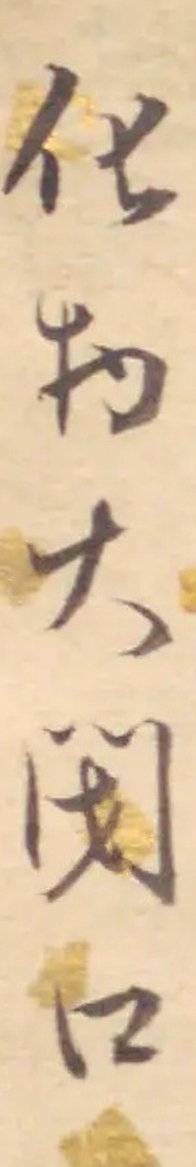化物大閉口
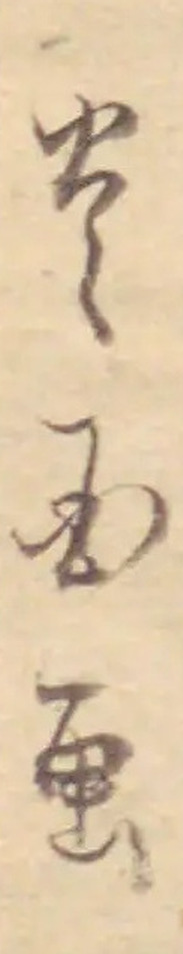豊国画

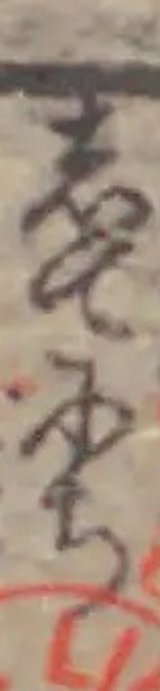してにち
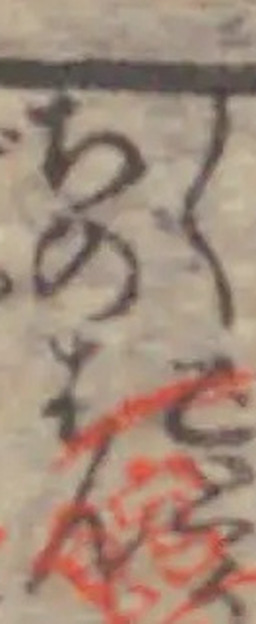ちのはん
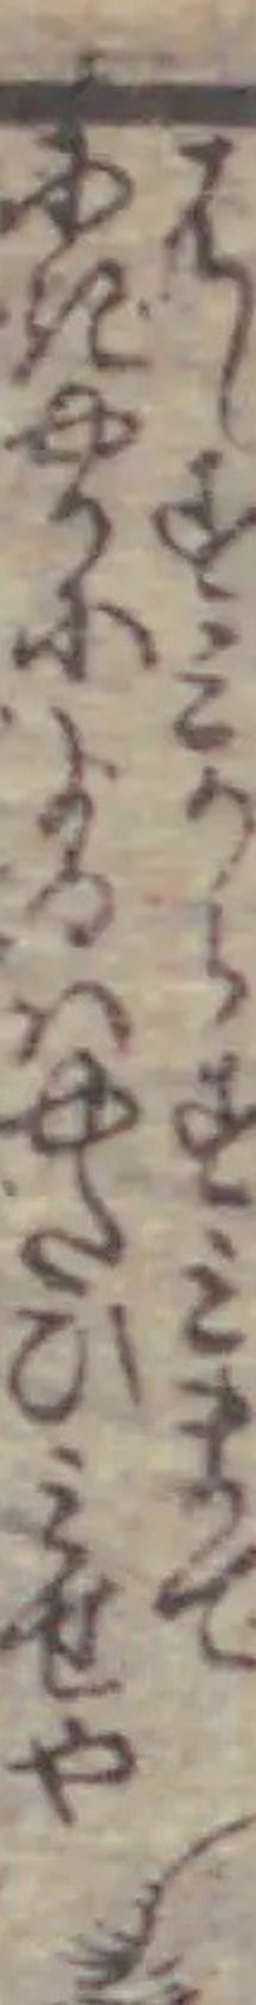にきやかによるはやたひみせや
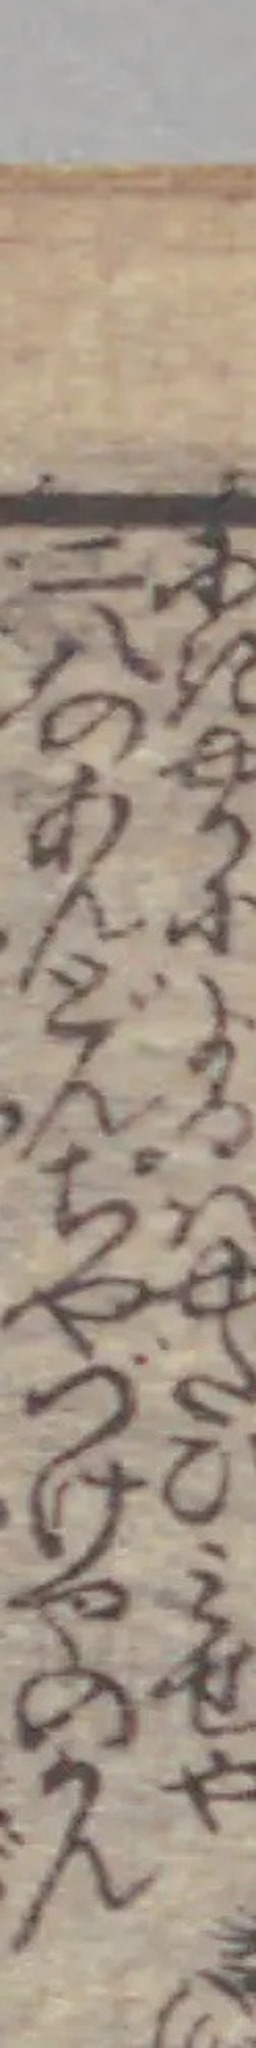二八のあんどんちやづけやのかん
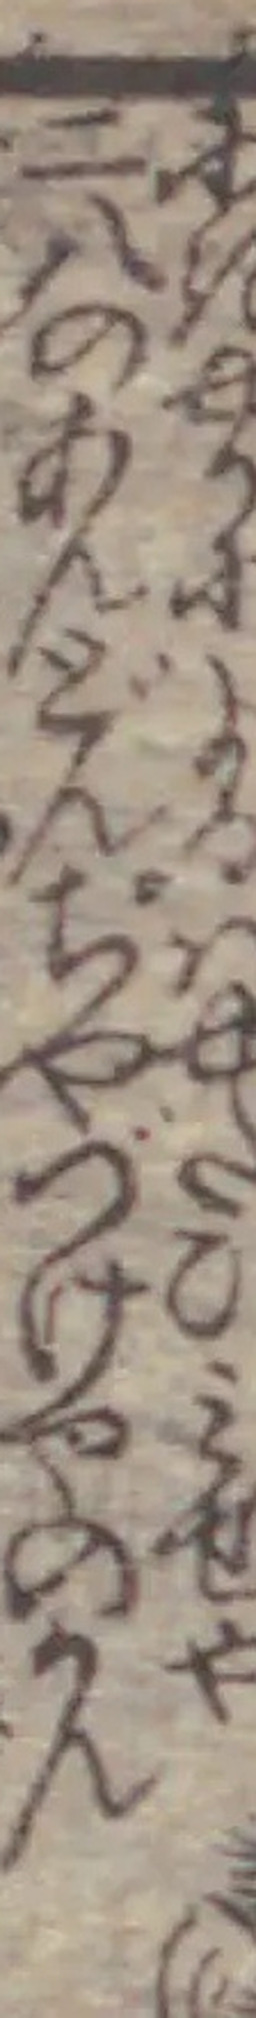二八のあんどんちやづけやのかん
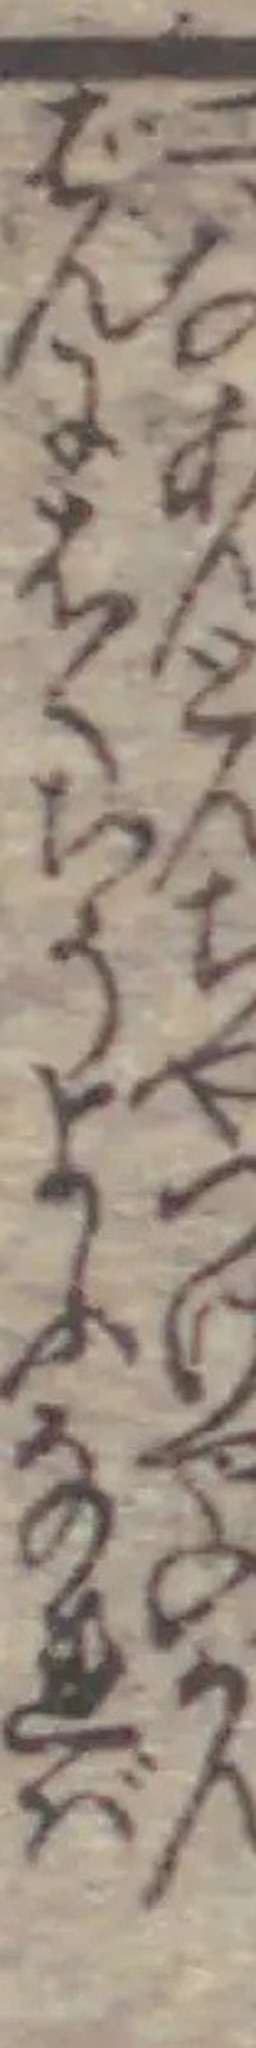ばんにはくちうよふなれば
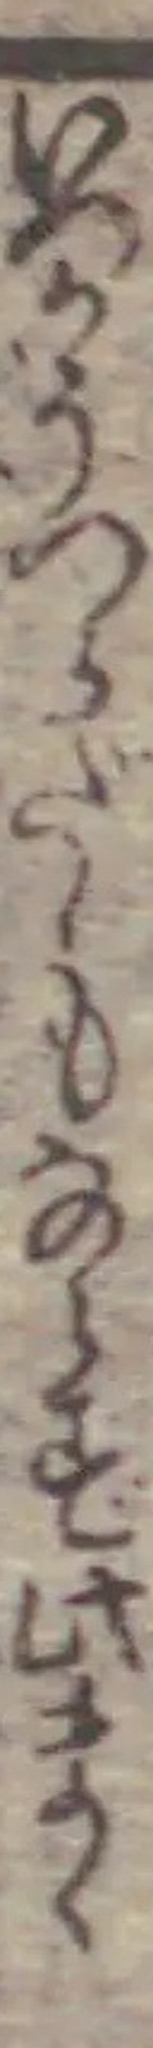いつかうつらだしもならず此まゝ
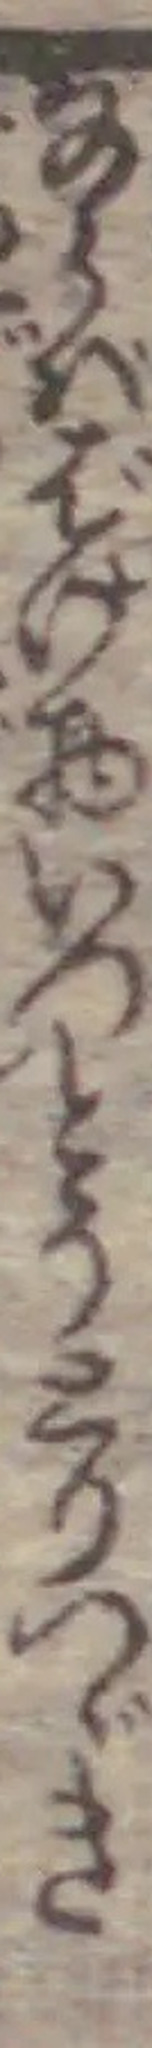ならばばけ物いつとうとりつゞき
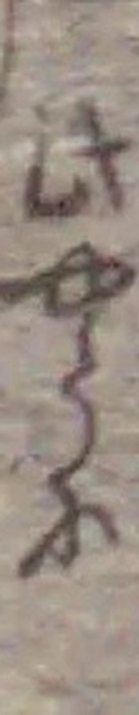じやうに
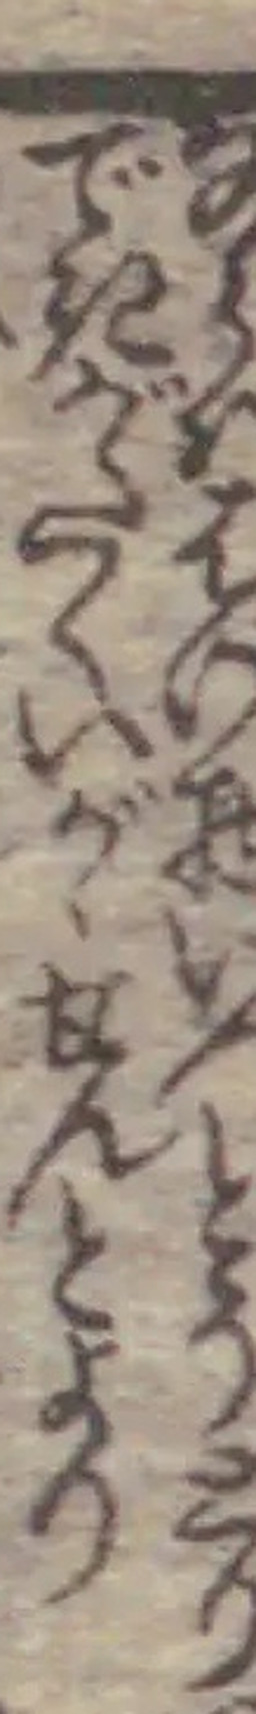できがたくいがゝせんとより
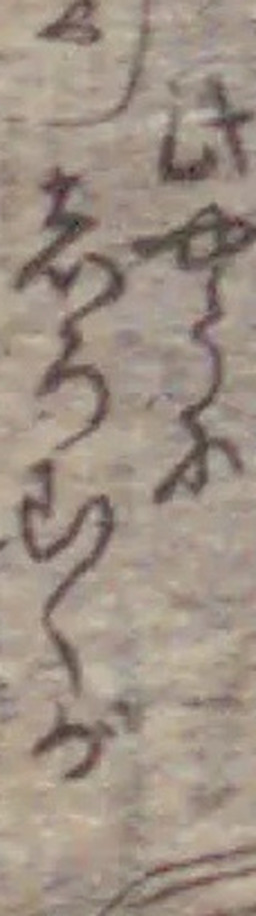しろむくが
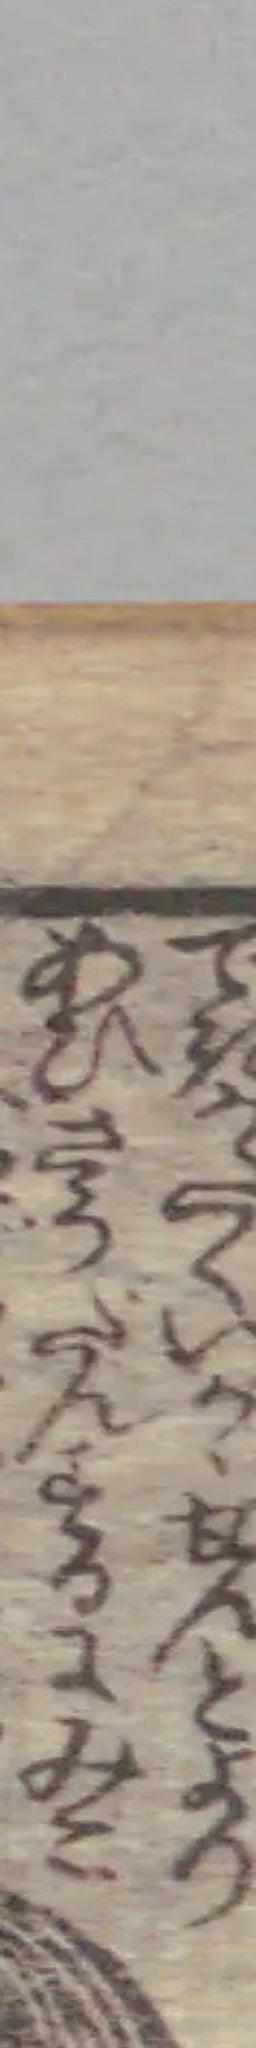あひさうだんするにみこ
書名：化物大閉口 2巻
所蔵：国立国会図書館 National Diet Library, JAPAN
